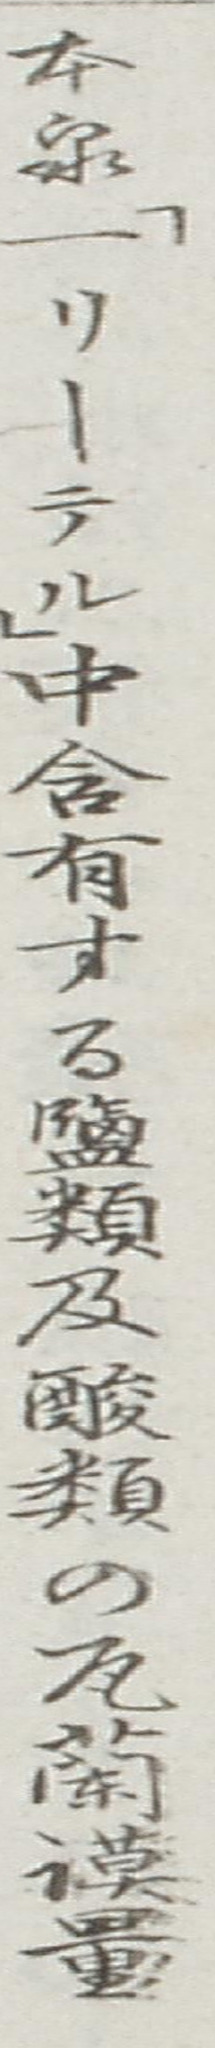本泉「一リーテル」中含有する鹽類の瓦蘭漠量

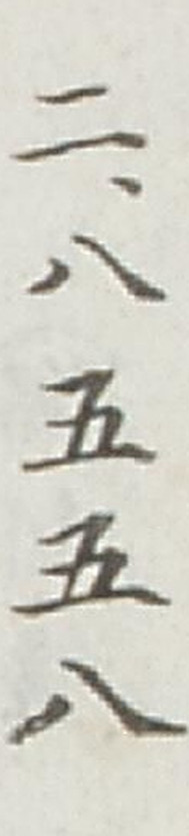合計二、八五五八
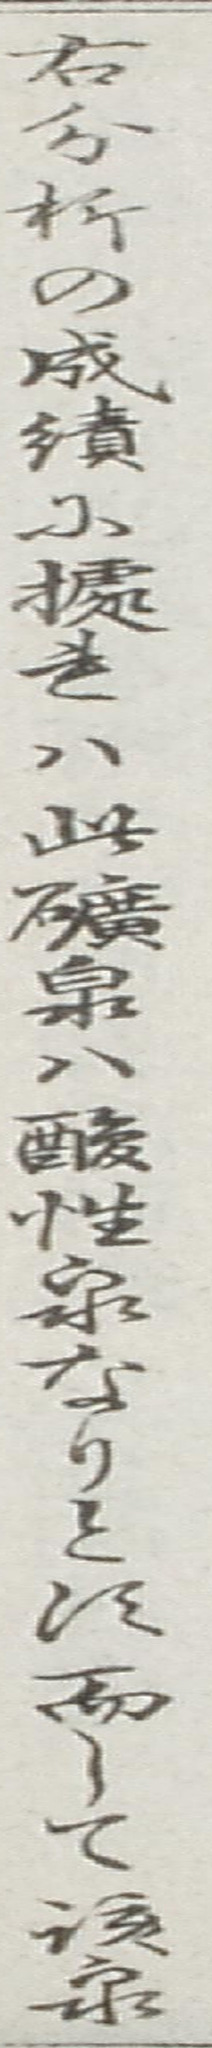右分析の成績に拠れは此鉱泉は酸性泉なりとす而して該泉
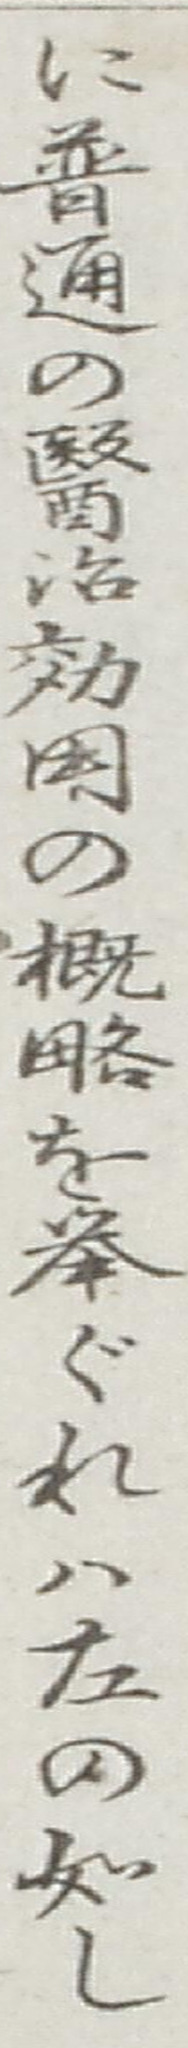に普通の医治效用の概略を挙ぐれは左の如し
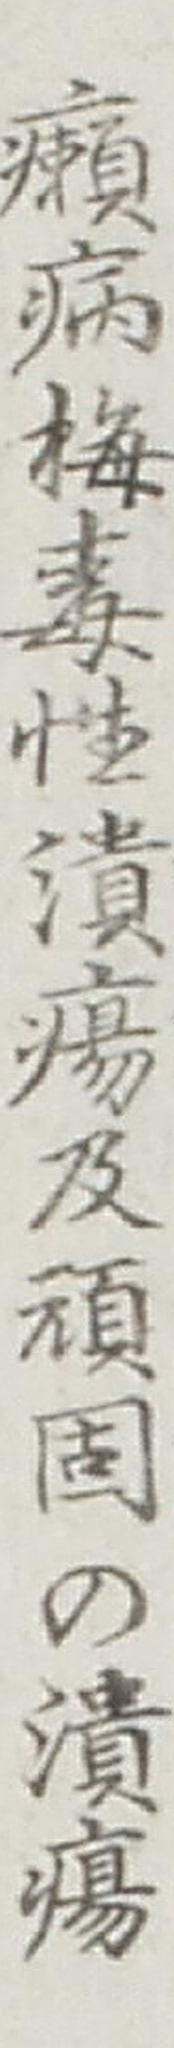癩病梅毒性潰瘍及頑固の潰瘍
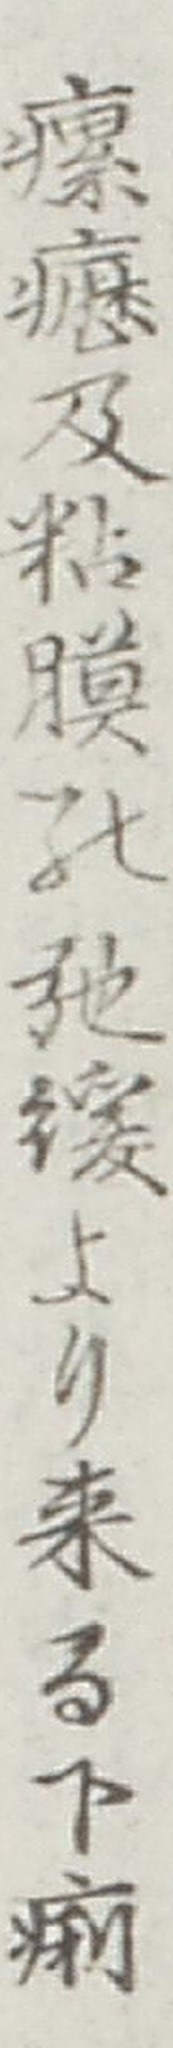瘰癧及粘液膜孔弛緩より来る下痢
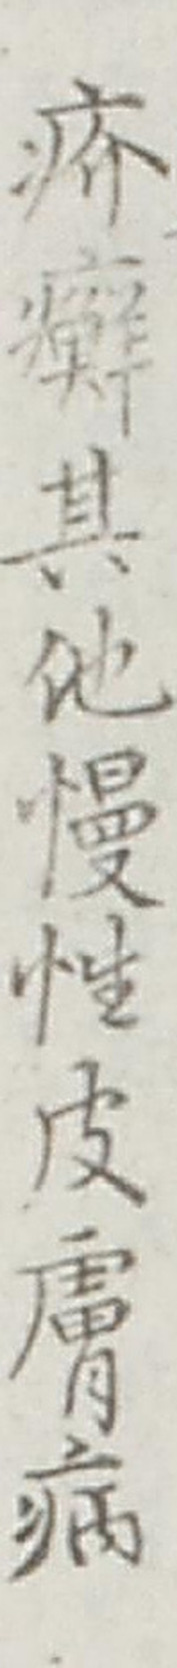疥癬其他慢性皮膚病
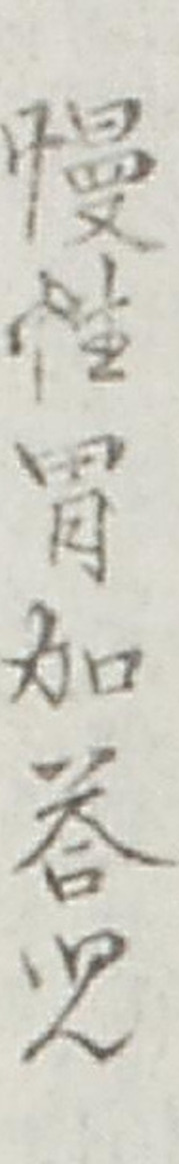慢性胃加答児
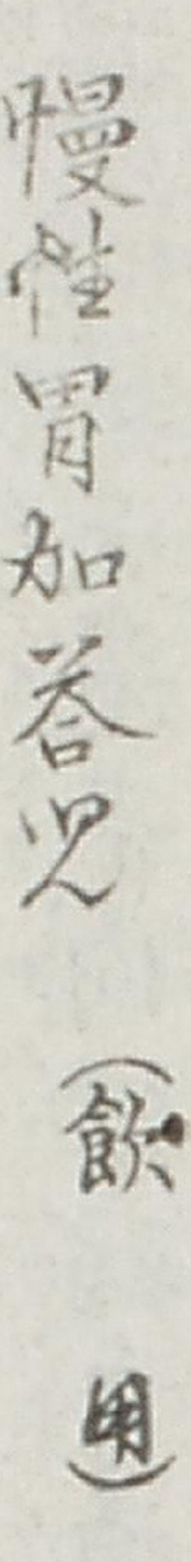慢性胃加答児
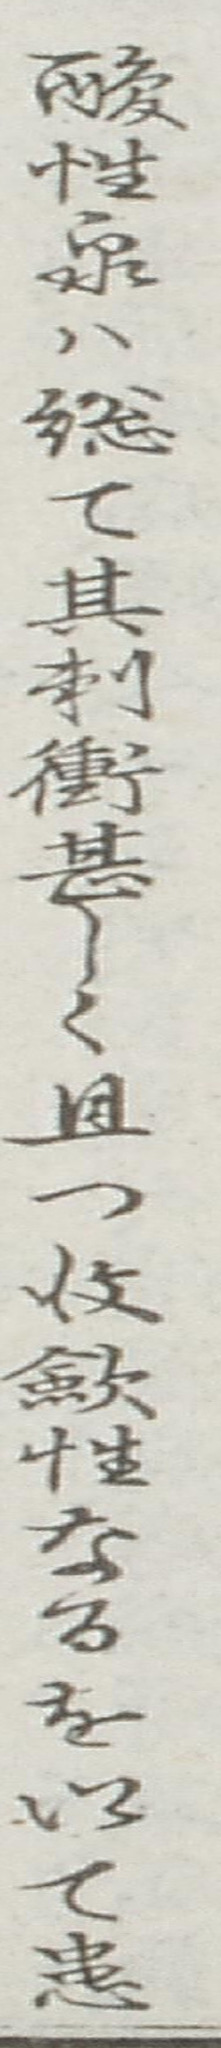酸性泉は総て其刺衝甚しく且つ收歛性なるをいて患
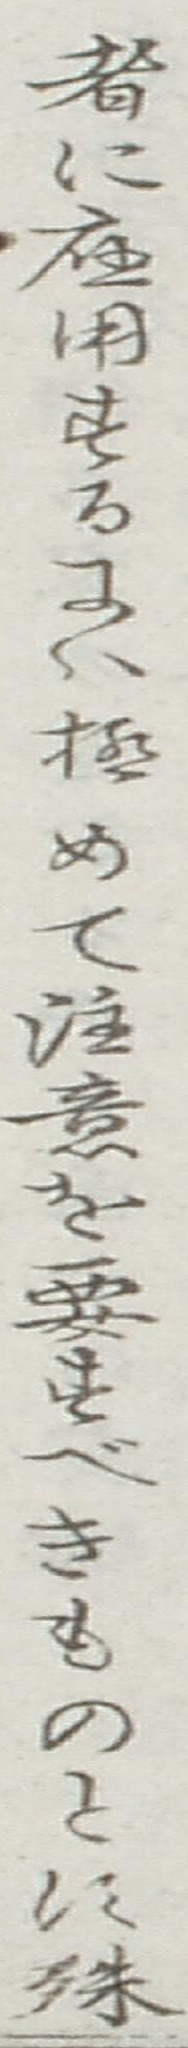者に応用するには極めて注意を要れべきものとす殊
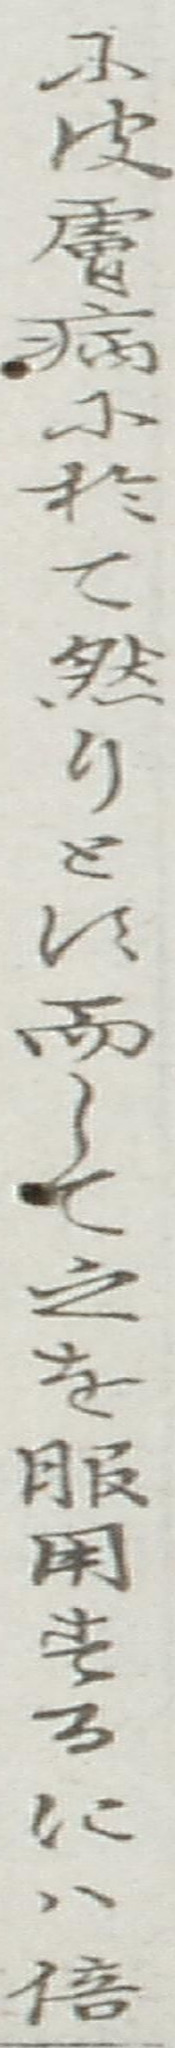に皮膚病に於て然リとす而して之を服用するには倍
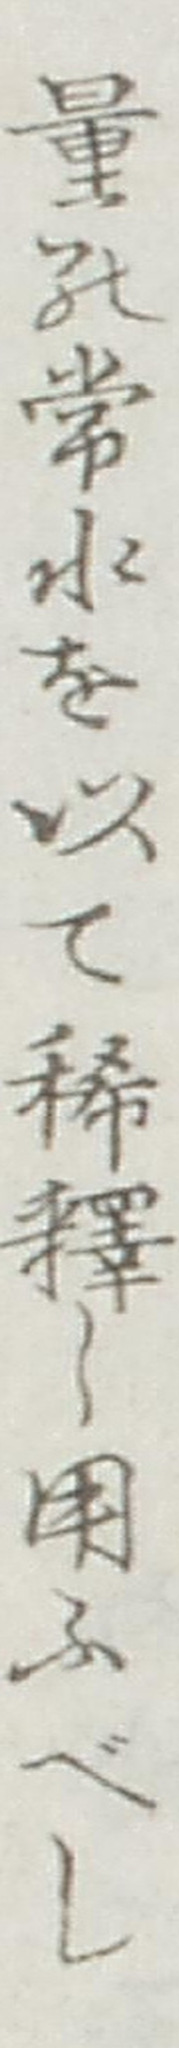量の常水を以て稀釋し用ふべし
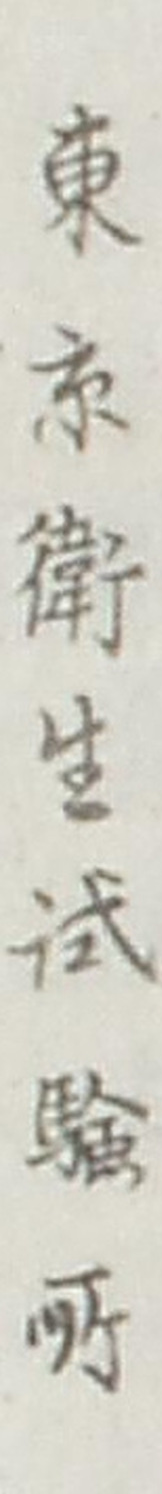東京衞生試験所

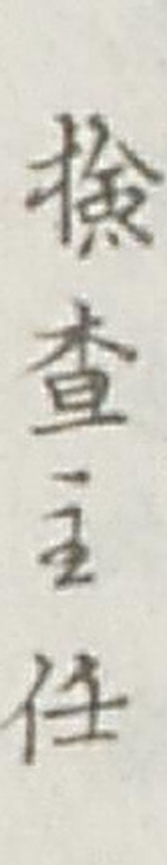検査主任
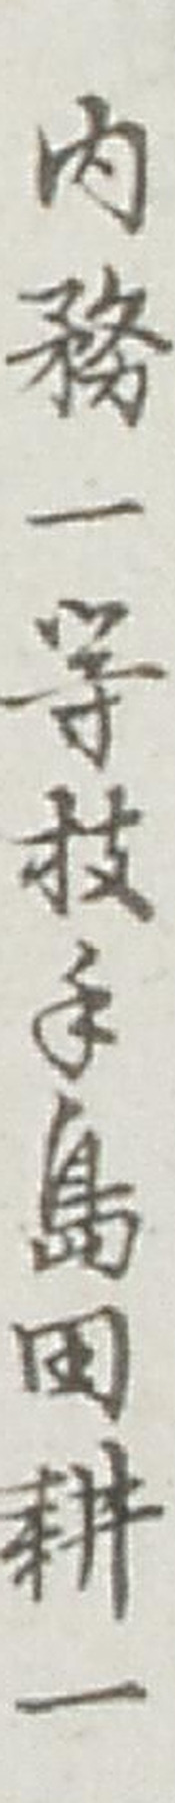内務一等技手島田耕一
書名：草津温泉誌　全
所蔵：東京大学地震研究所図書室 Earthquake Research Institute Library, The University of Tokyo, JAPAN
